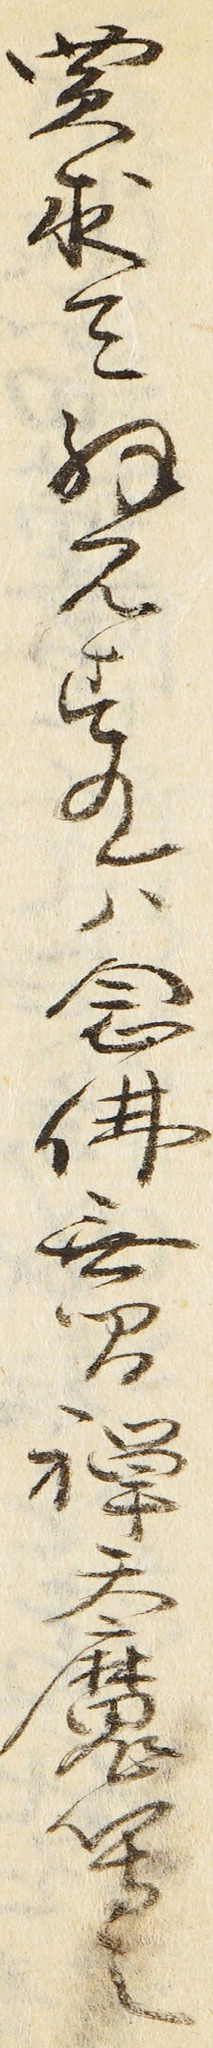買求て拝見すれは念佛無間禅天魔等之
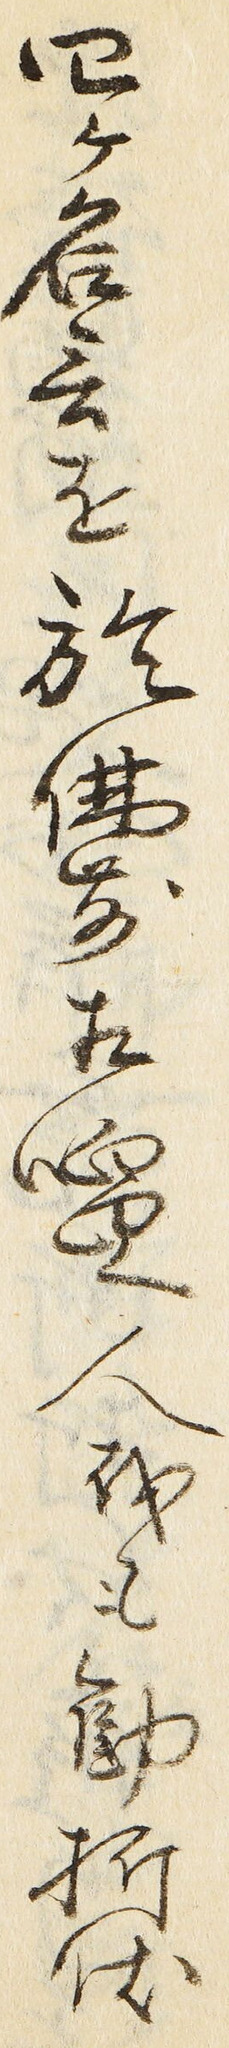四ケ名言を於仏前相唱へ人をも勧折伏
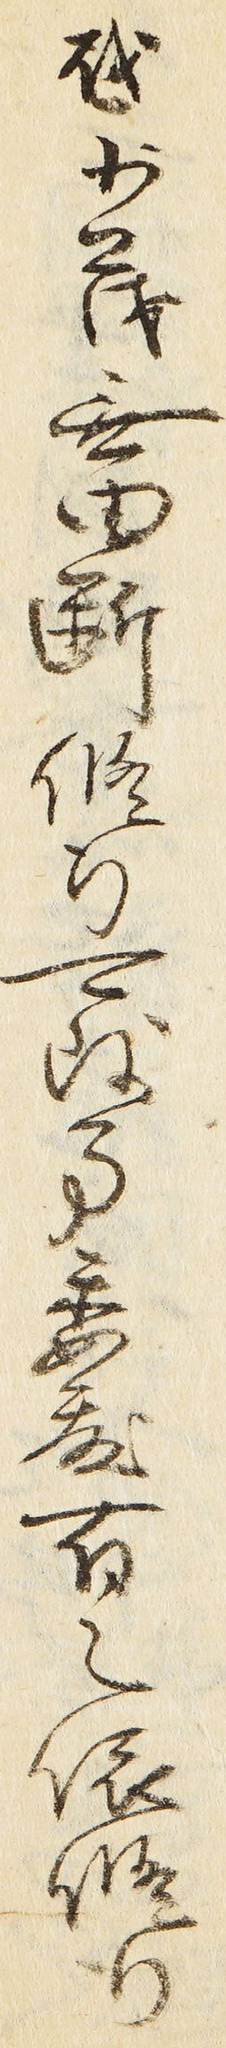を少も無由断修行可致事委敷有之依修行
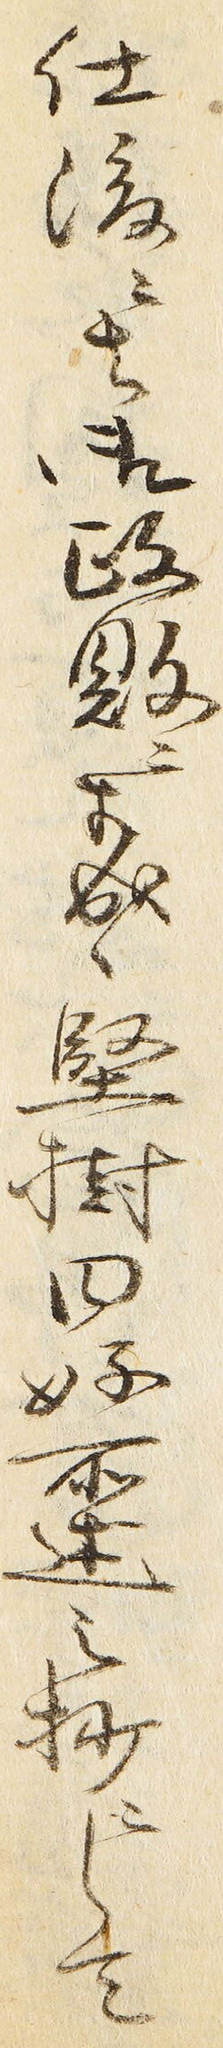仕後には御政敗に相成候堅樹日好所述之抄にして
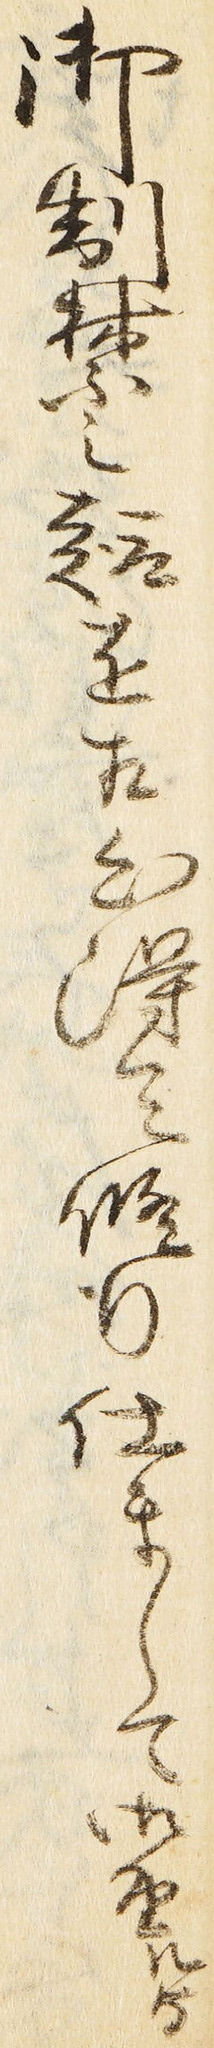御制禁之趣を相心得て修行仕まして御座候と
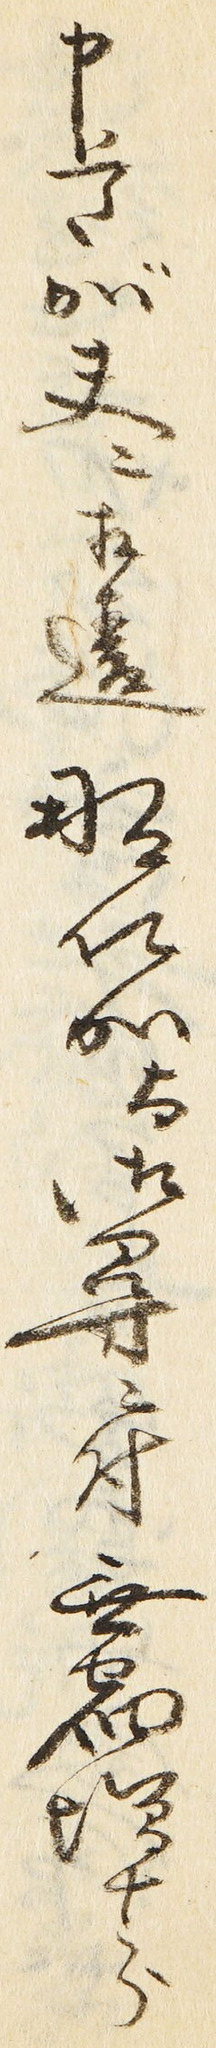申上候が夫に相違ないかと御尋に付無宿増十郎
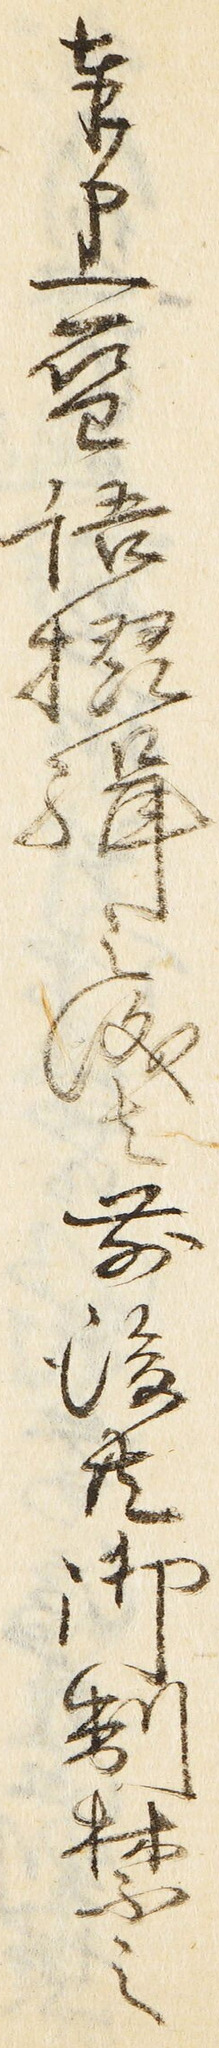奉申上聖語撰緝之儀は前後共御制禁之
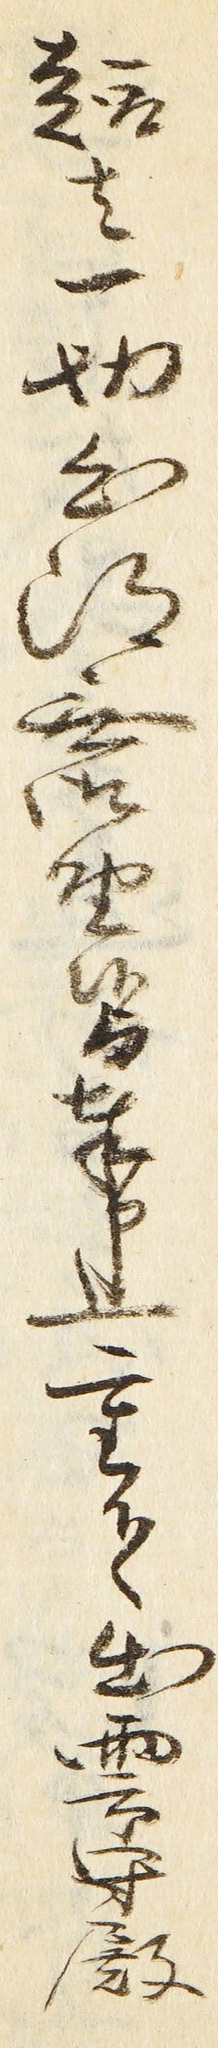趣は一切心得無御座候旨奉申上重て出雲守殿
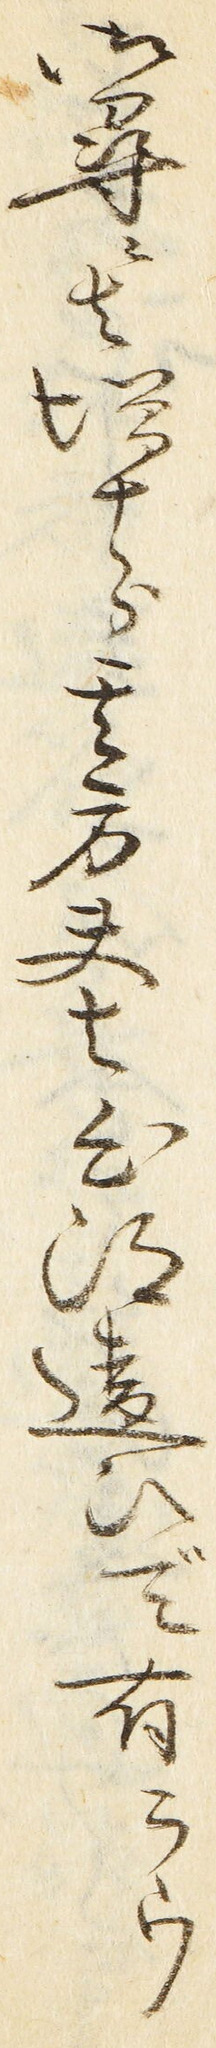御尋には増十郎其方夫は心得違ひで有らう
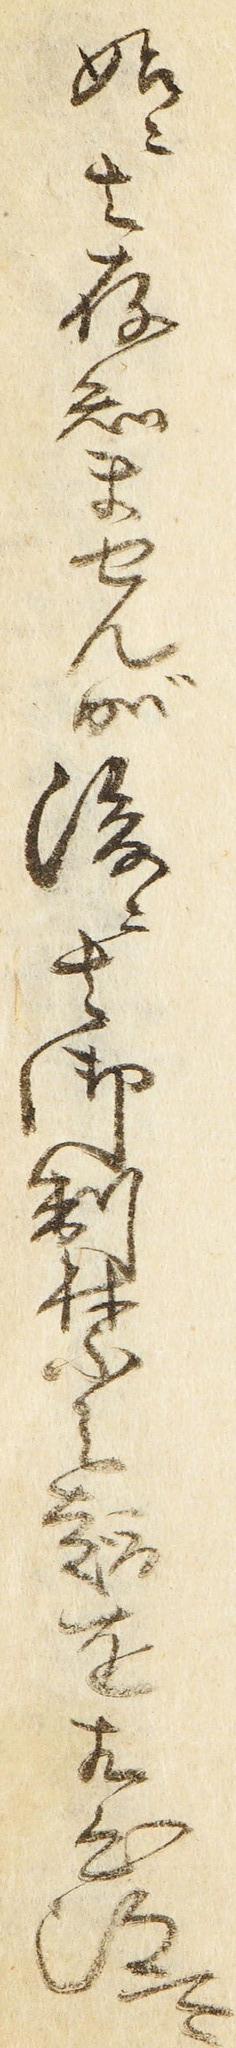始には存知ませんが後には御制禁之趣を相心得て

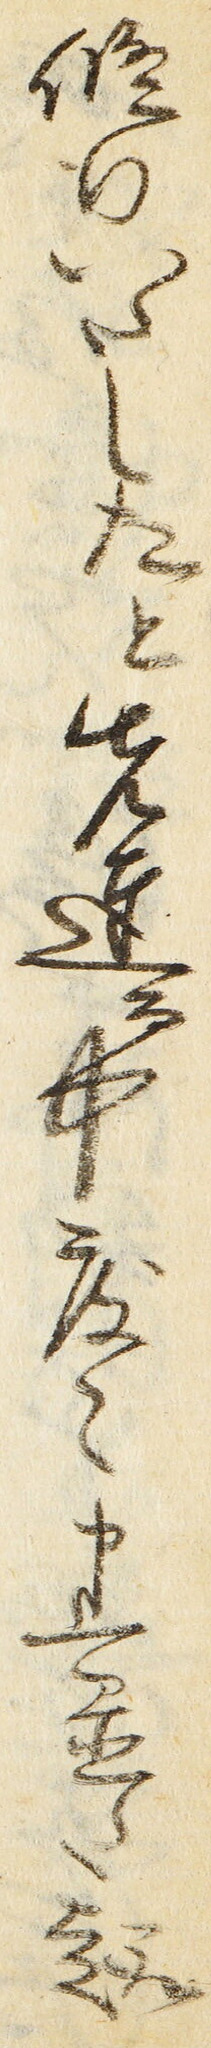修行いたしたと先達而中度々申上置候趣
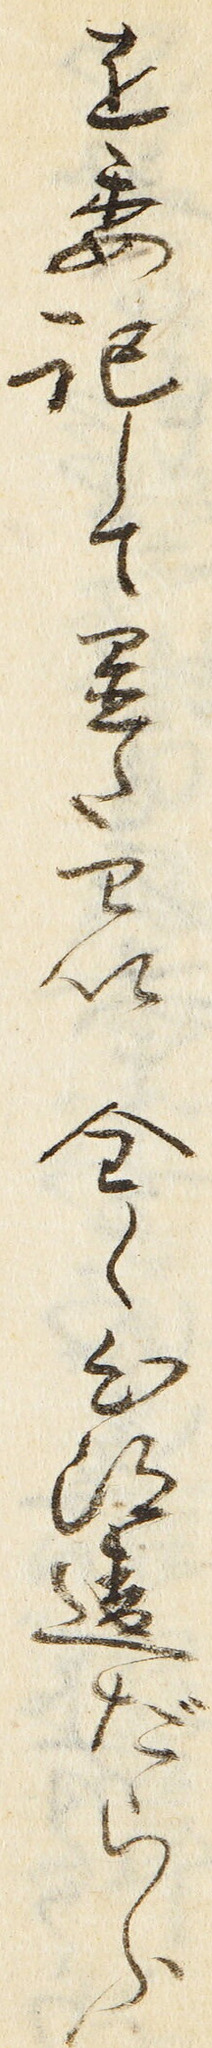を委記して置たわい全く心得違だらふ
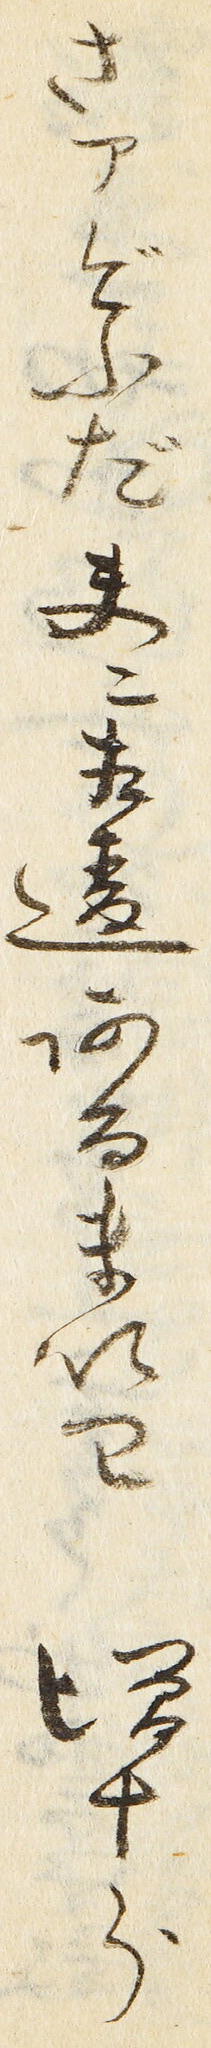さアどふだ夫に相違あるまいわ増十郎
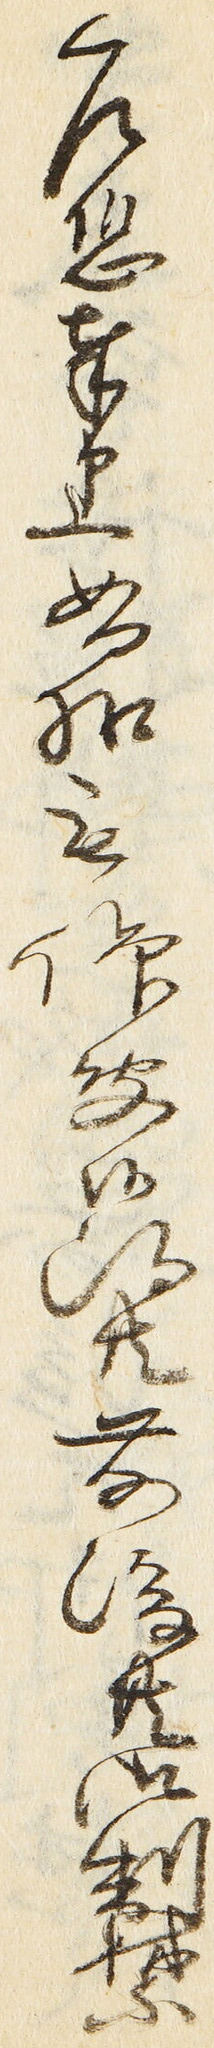乍恐奉申上如何様被仰聞候得共前後共御制禁
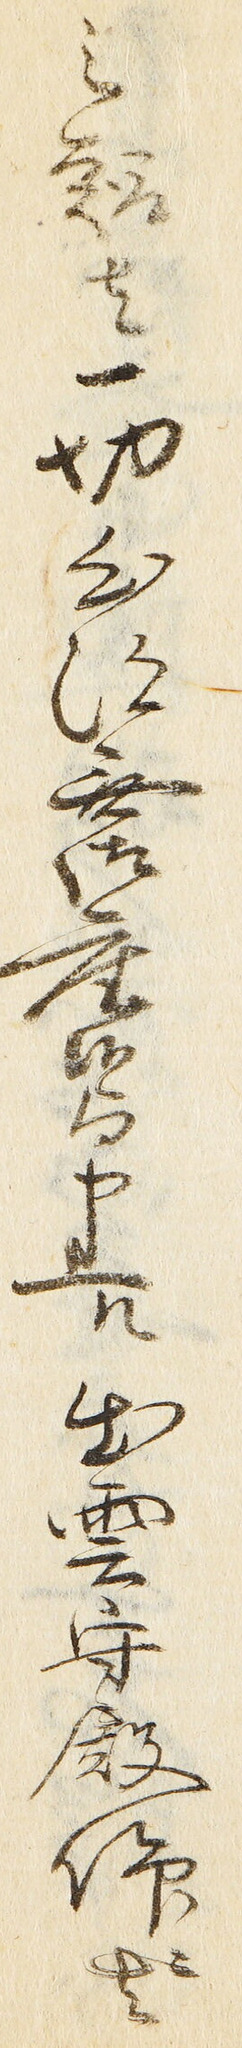之趣は一切心得無御座候と申上る出雲守殿仰には
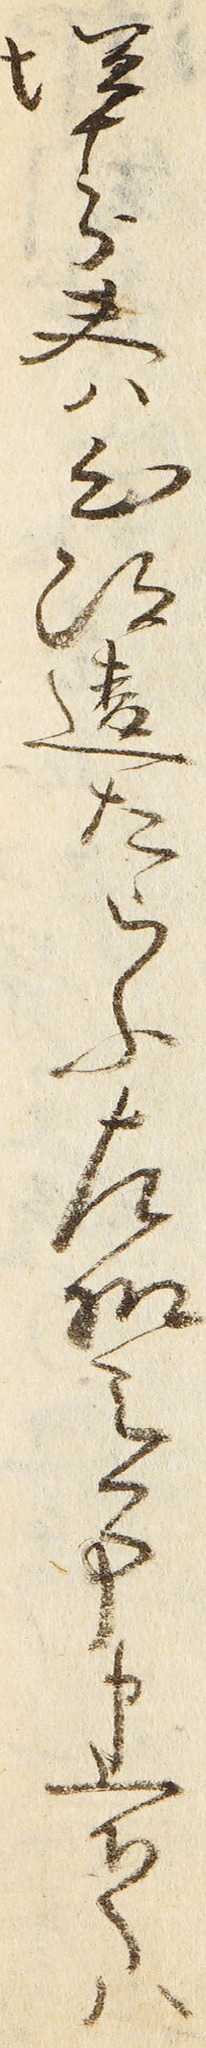増十郎夫は心得違たらふ左様之事申上げては
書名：異流一件日記
